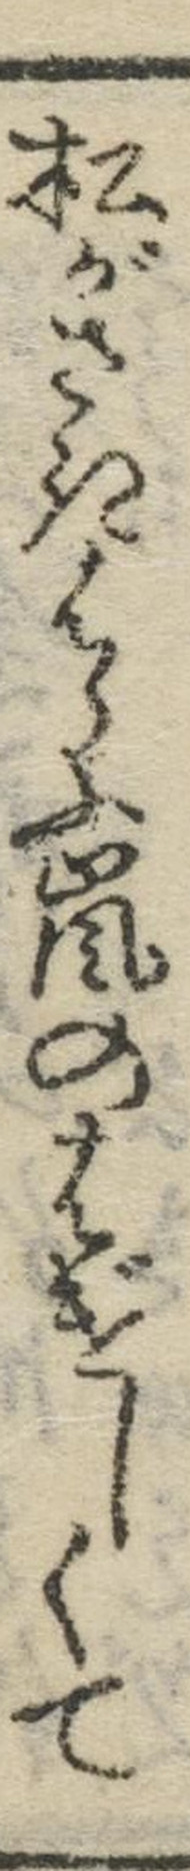松がさきはらふ嵐のはげしくて
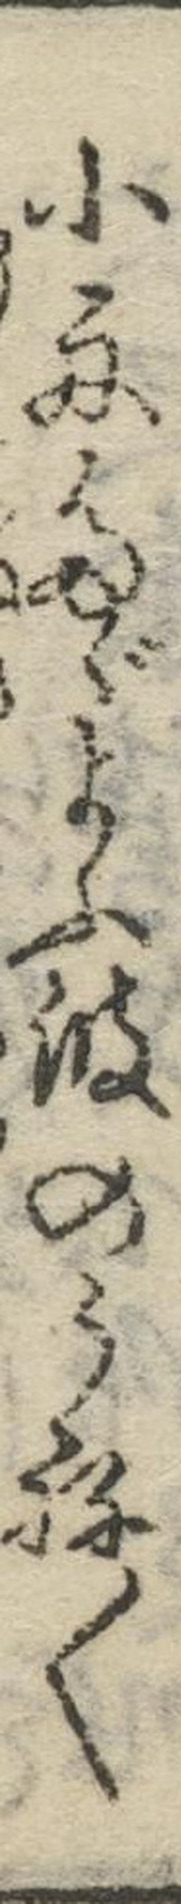小舟たゞよふ波のうね〳〵
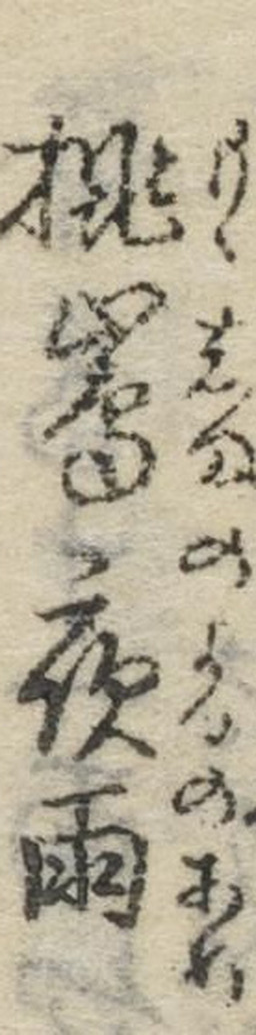桃嶌夜雨
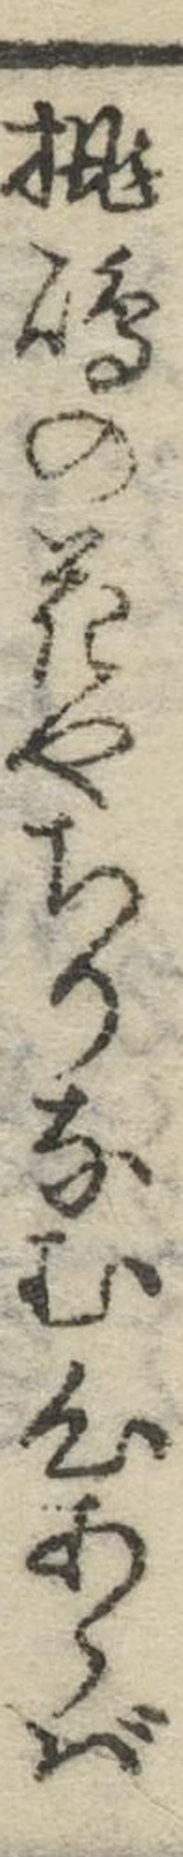桃嶋の花やちりなむ心あらば
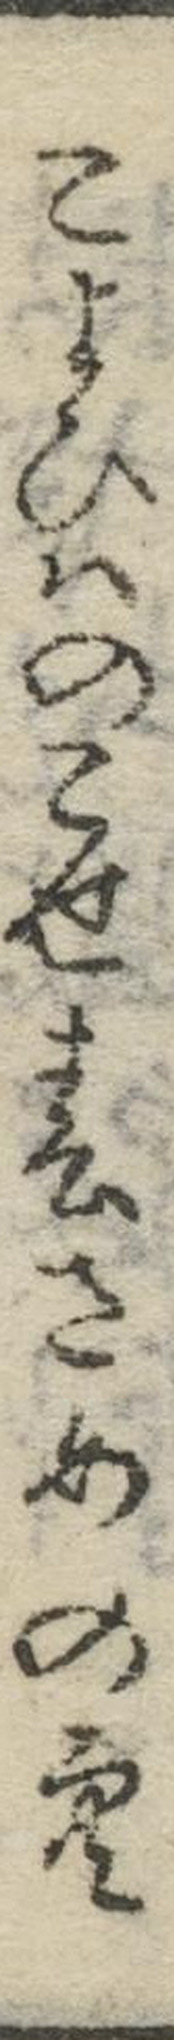こよひはのこせ春さめの空
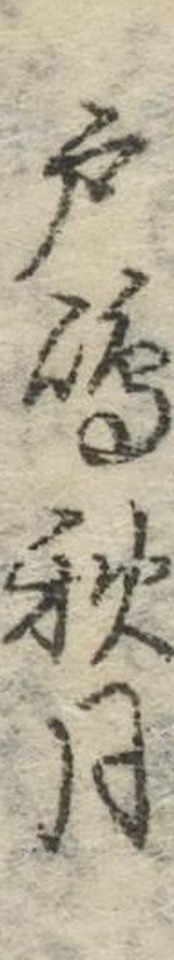戸嶋秋月
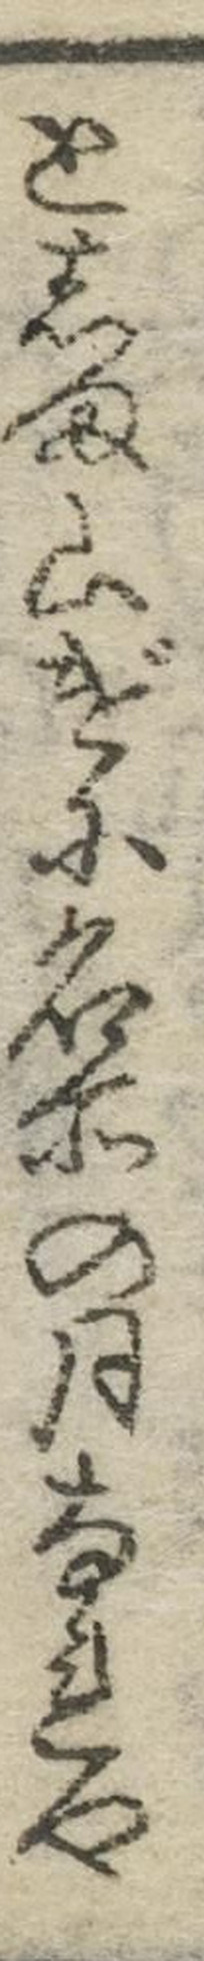としま山げに名所の月なれや
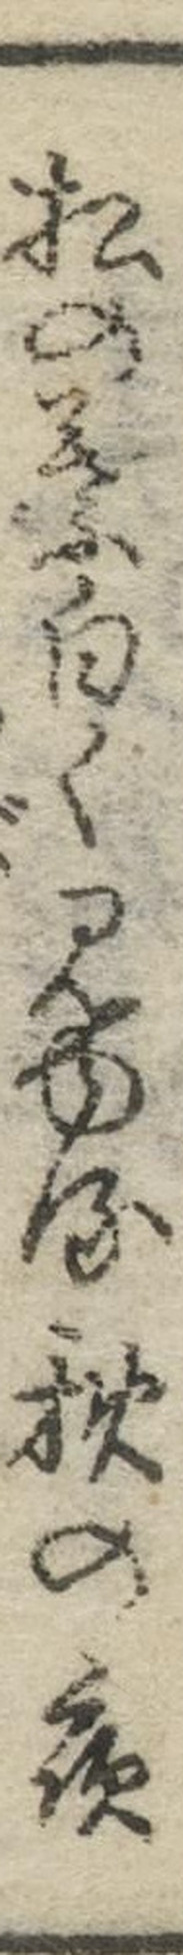松の葉白く見ゆる秋の夜
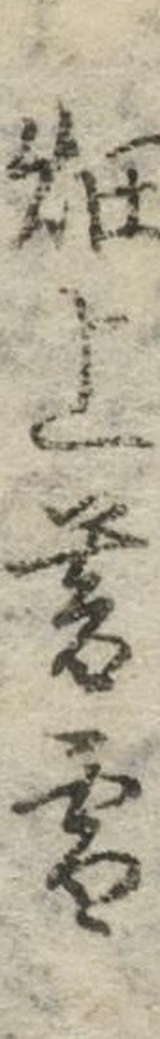畑上暮雪
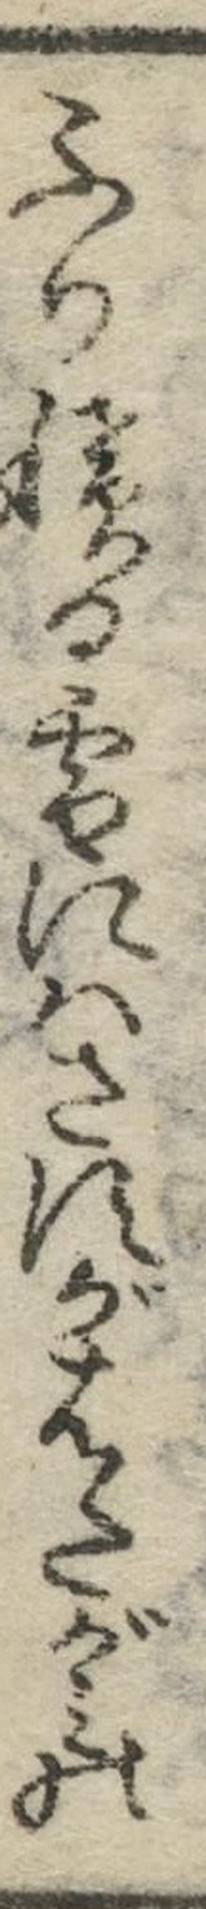ふり積る雪にはさすがはたがみの
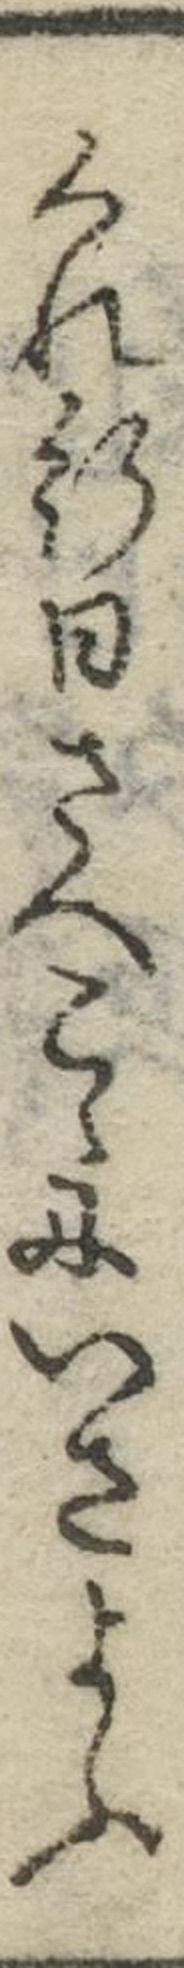くれ行日さへこゝにいさよふ

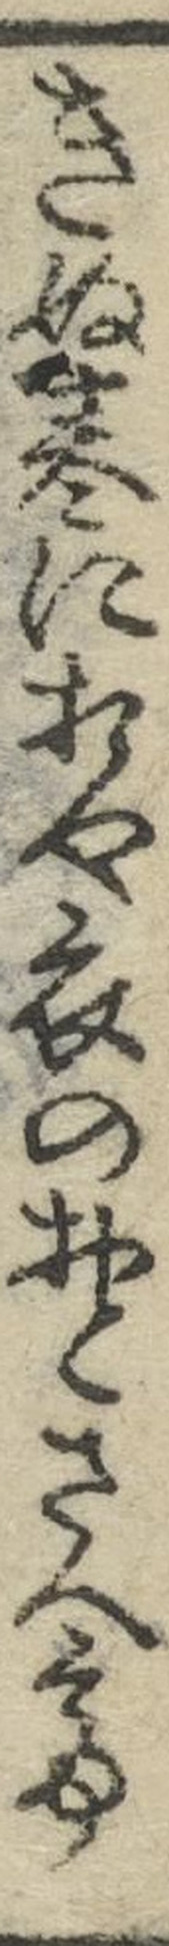きぬ巻に打や衣のおとさへて
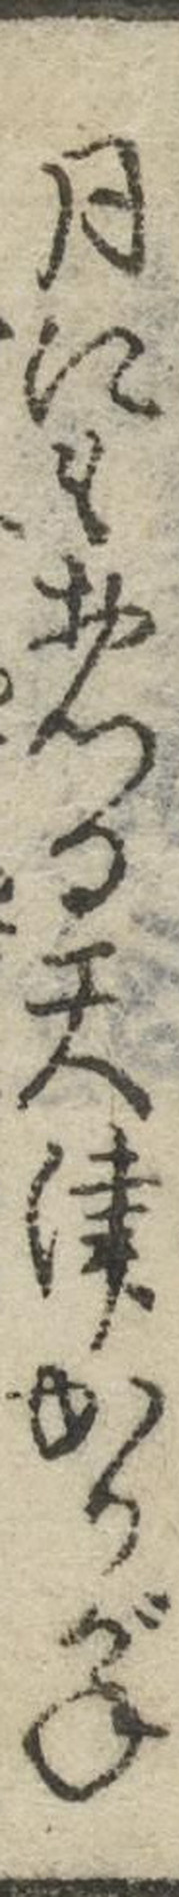月にもおつる天津かりがね
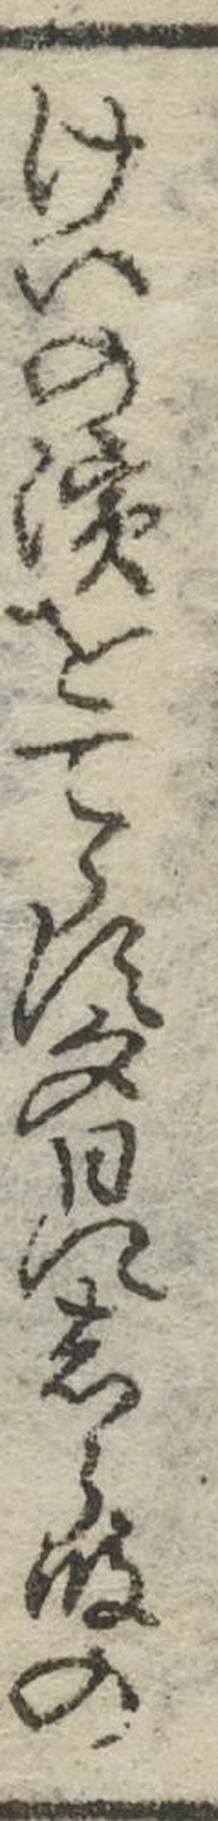けいの湊をてらす夕日にしら波の
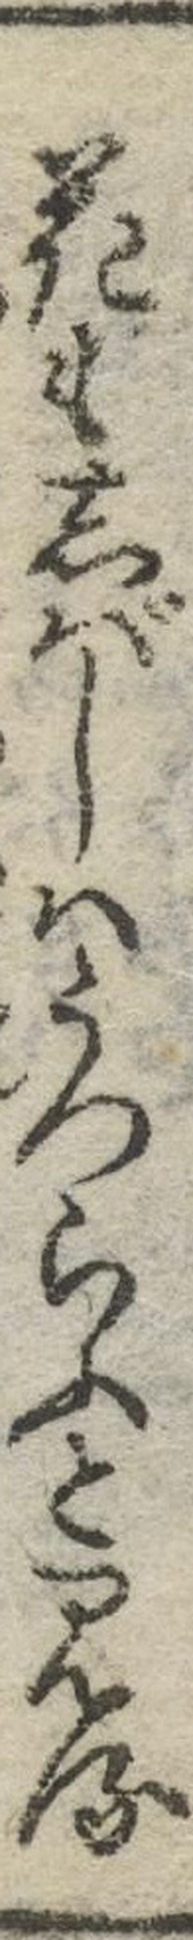花もしばしうるらふと見る
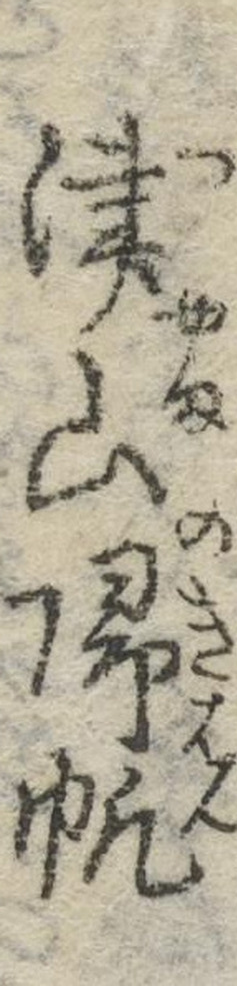津山の帰帆
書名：但州城崎浴湯辧
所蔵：東京大学地震研究所図書室 Earthquake Research Institute Library, The University of Tokyo, JAPAN
